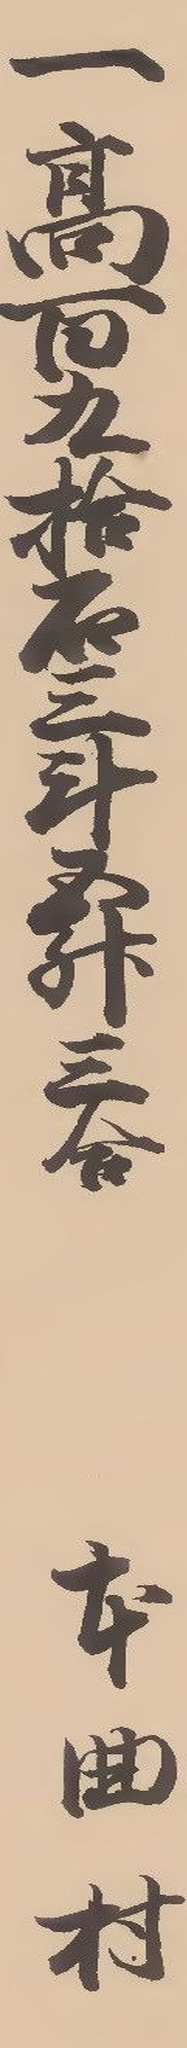一高百九拾石三斗五升三合本曲村
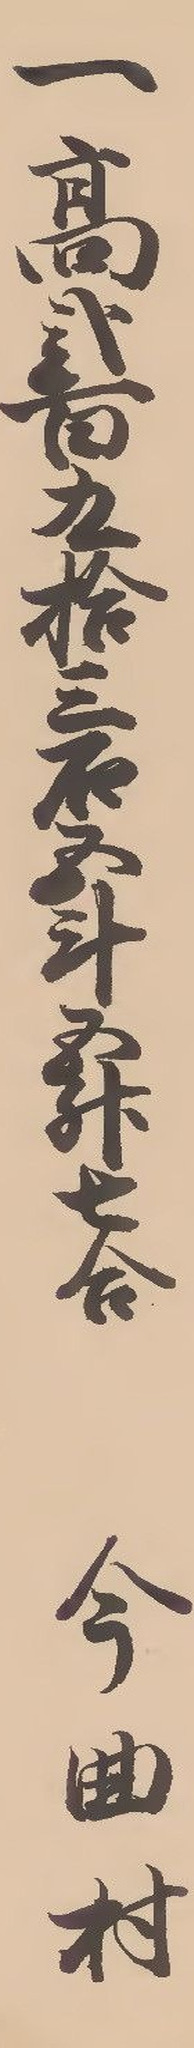一高弐百九拾三石五斗五升七合今曲村

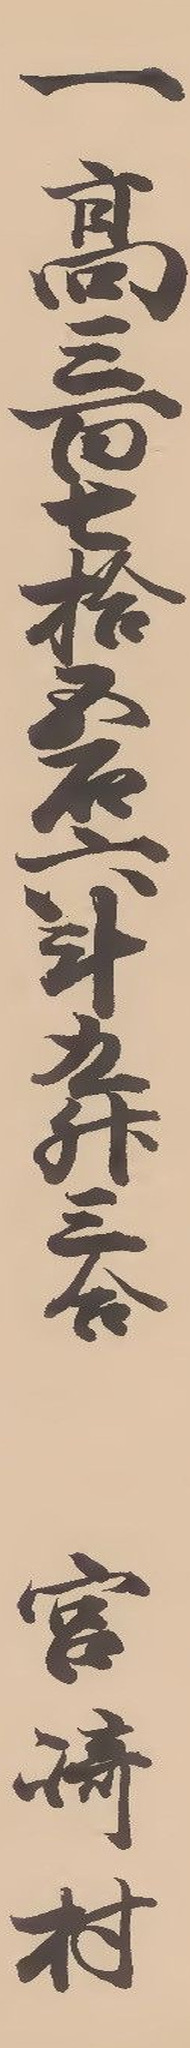一高三百七拾五石六斗九升三合宮崎村
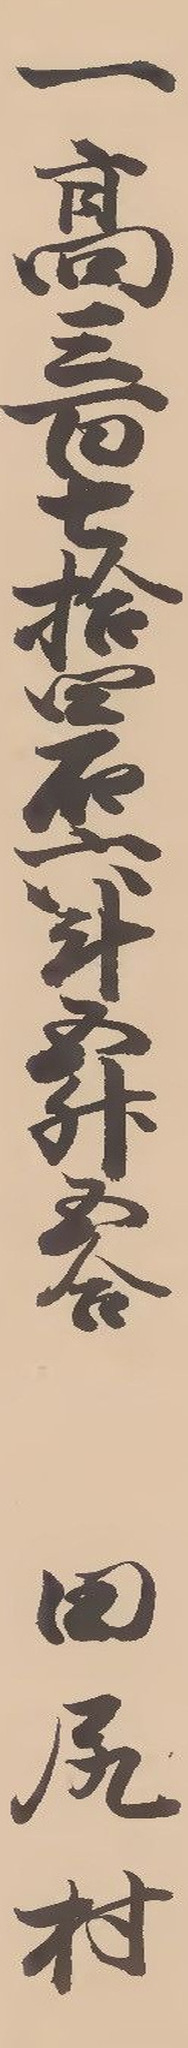一高三百七拾四石六斗五升五合田尻村
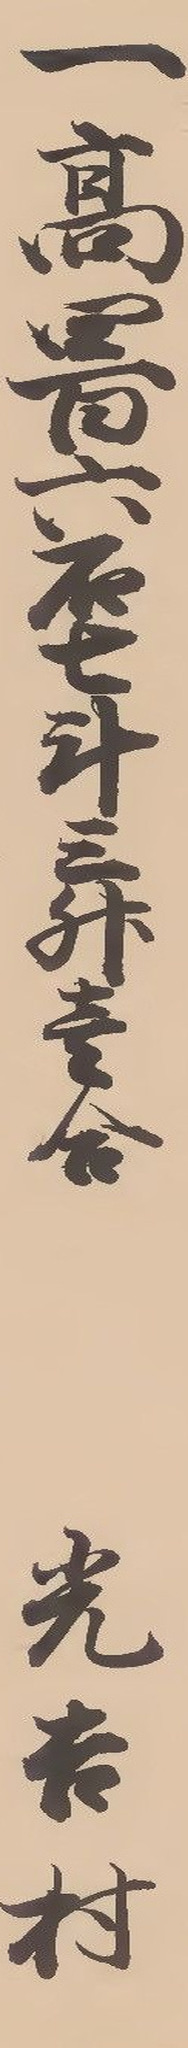一高四百六石七斗三升壱合光吉村
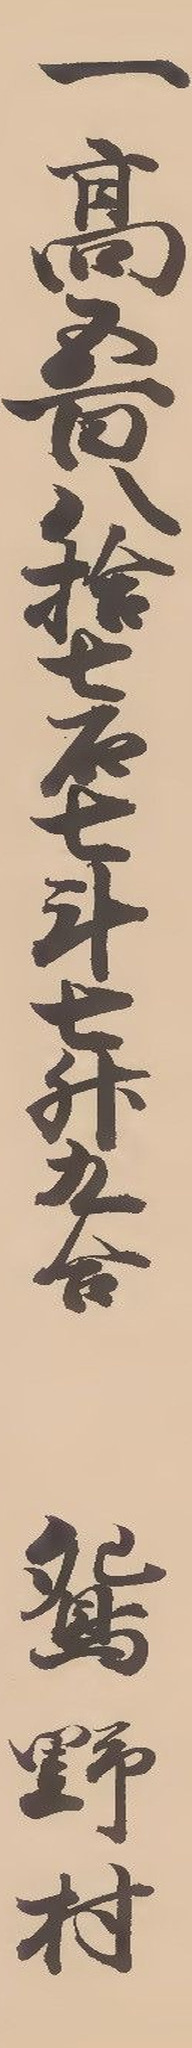一高五百八拾七石七斗七升九合鴛野村
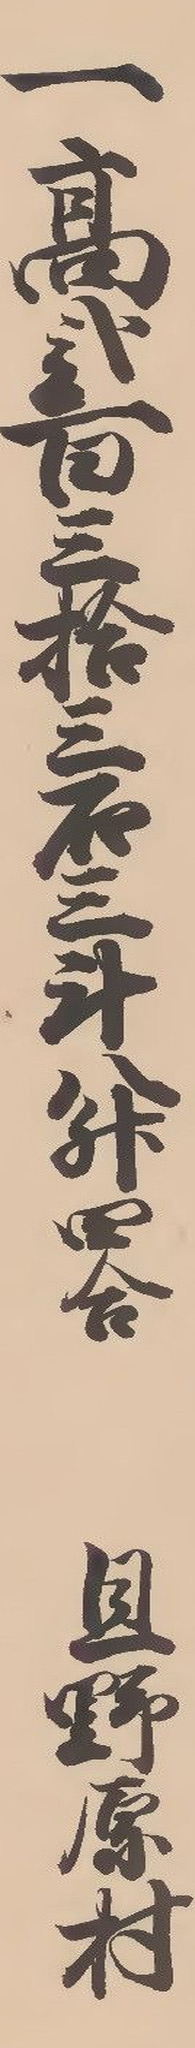一高弐百三拾三石三斗八升四合旦野原村
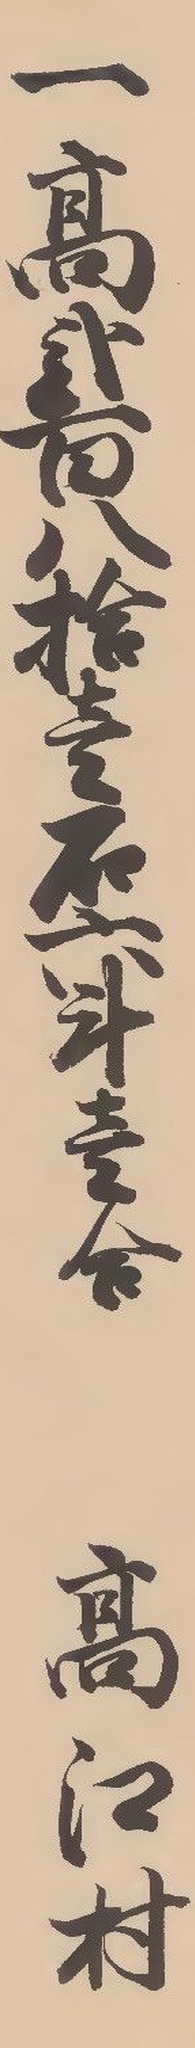一高弐百八拾壱石六斗壱合高江村
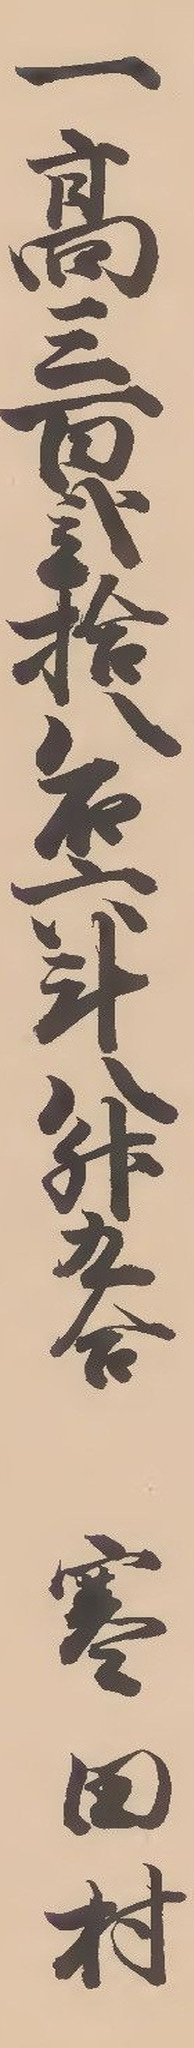一高三百弐拾八石六斗八升九合寒田村

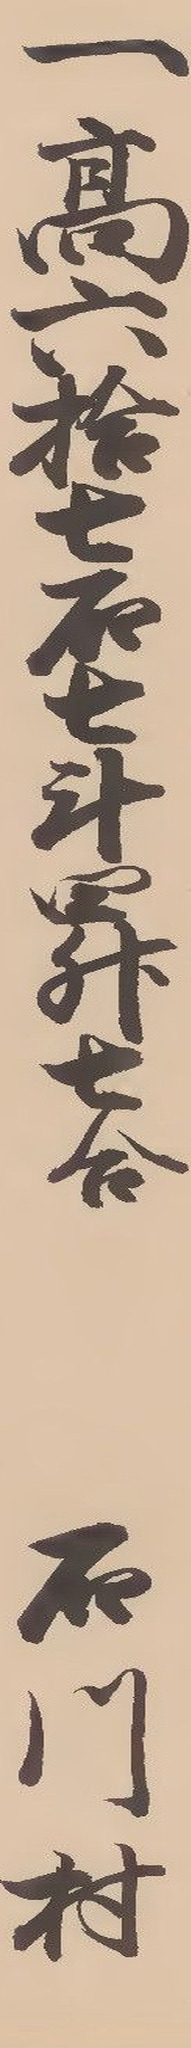一高六拾七石七斗四升七合石川村
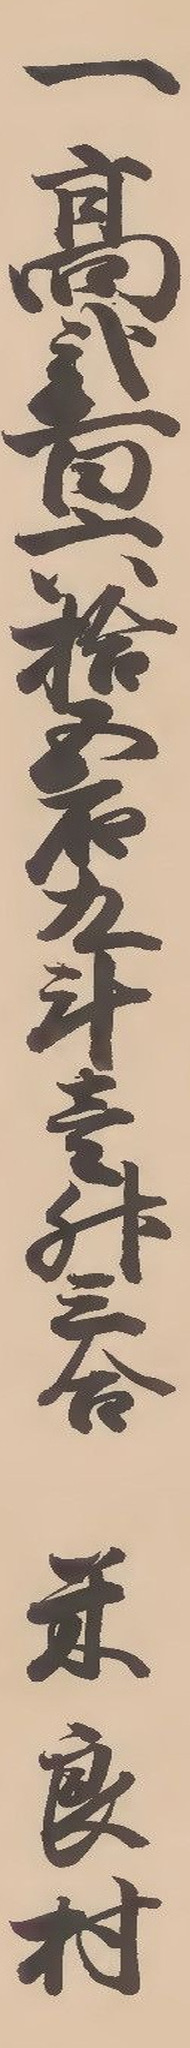一高弐百六拾五石九斗壱升三合米良村
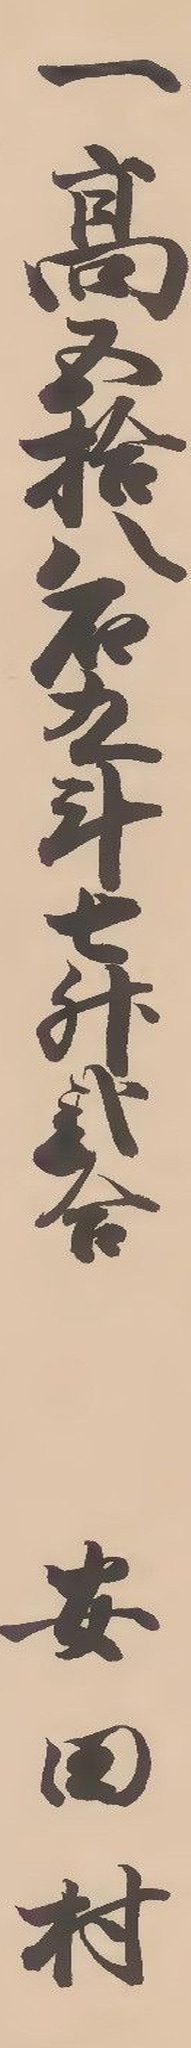一高五拾八石九斗七升弐合安田村
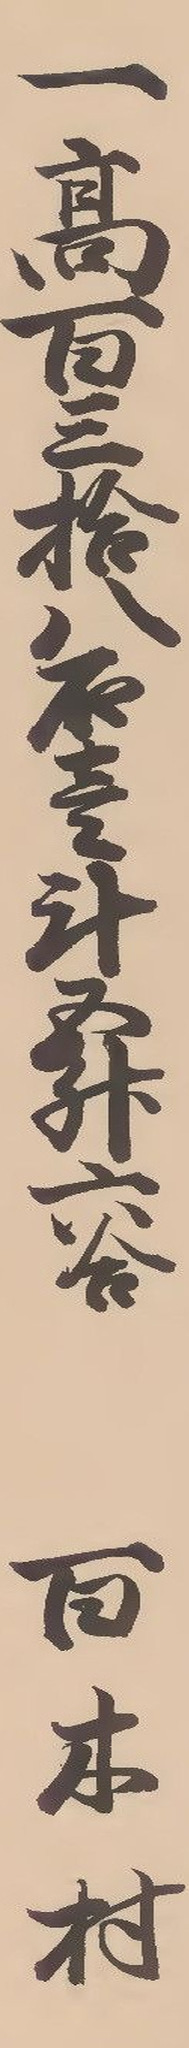一高百三拾八石壱斗五升六合百木村
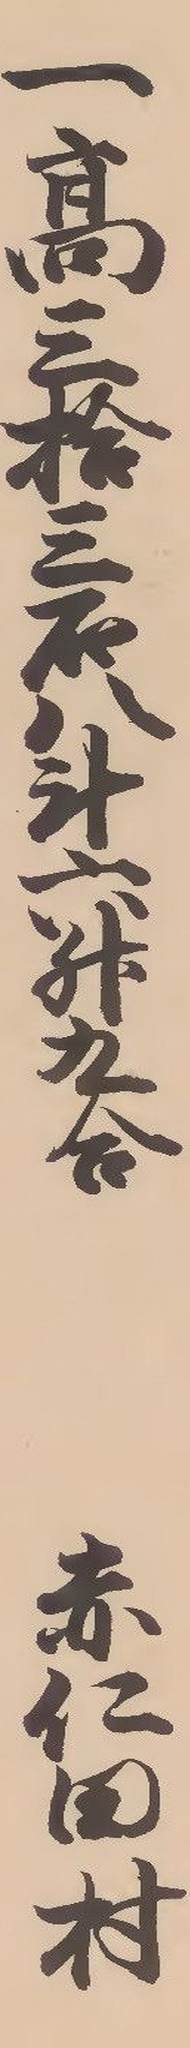一高三拾三石八斗六升九合赤仁田村
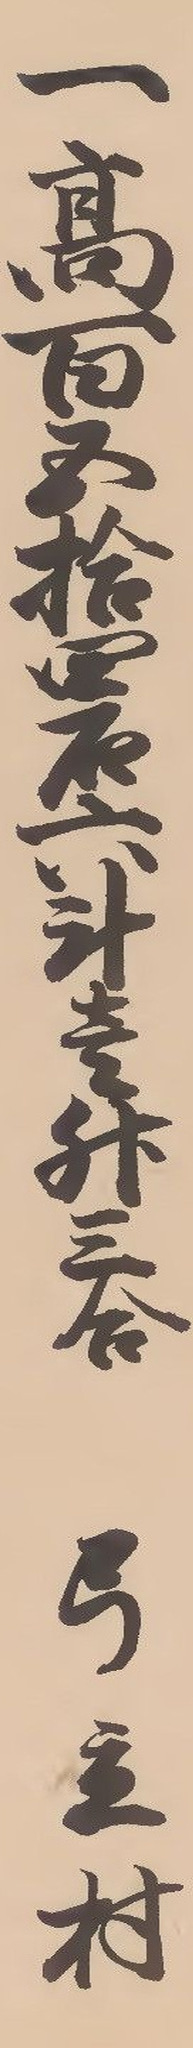一高百五拾四石六斗壱升三合弓立村
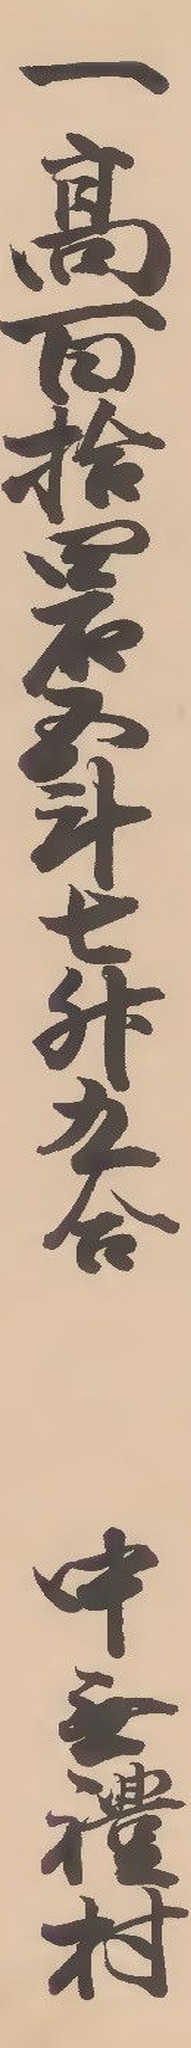一高百拾四石五斗七升九合中無礼村
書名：豊後国郷帳
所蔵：国立公文書館 National Archives of Japan
